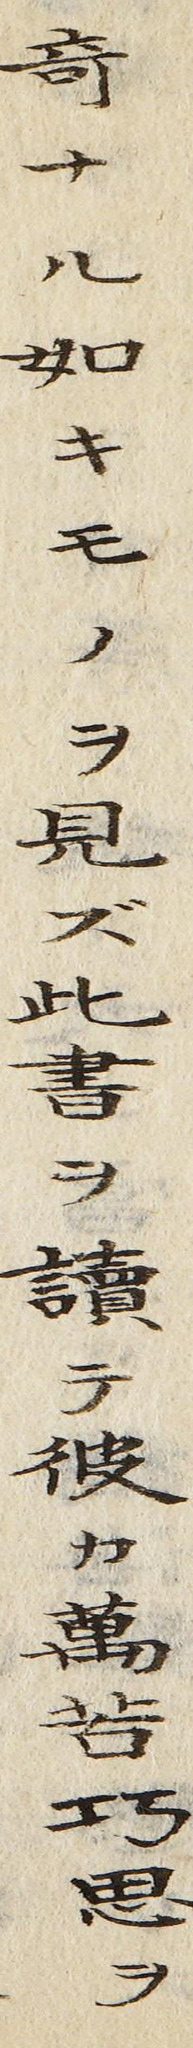奇ナル如キモノヲ見ズ此書ヲ読テ彼カ万苦巧思ヲ
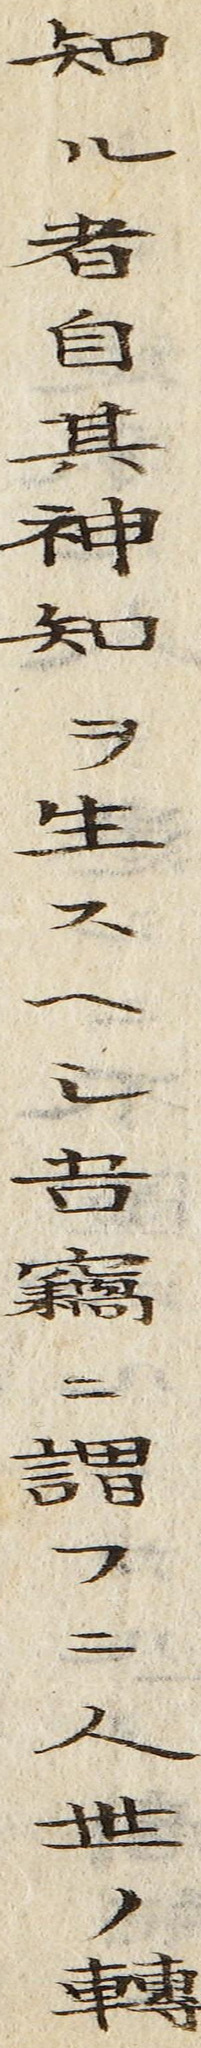知ル者自其神知ヲ生スヘシ吾窃ニ謂フニ人世ノ転
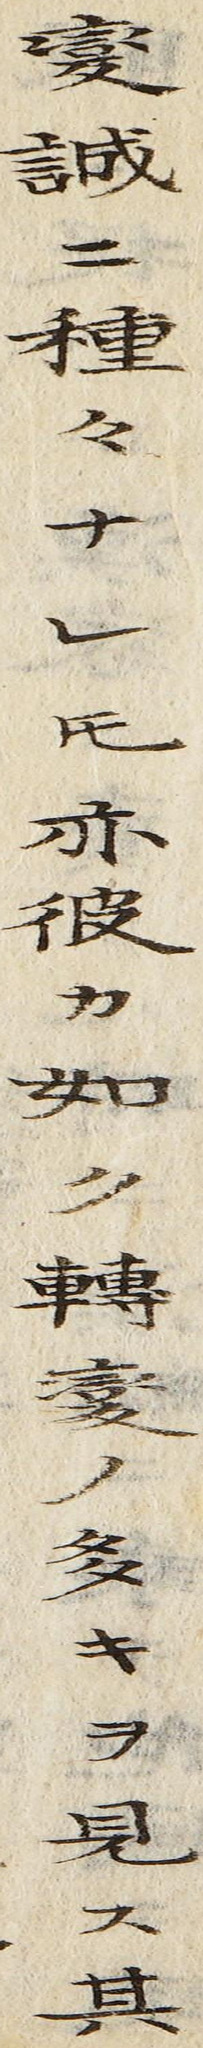変誠ニ種々ナレトモ亦彼カ如ク転変ノ多キヲ見ス其
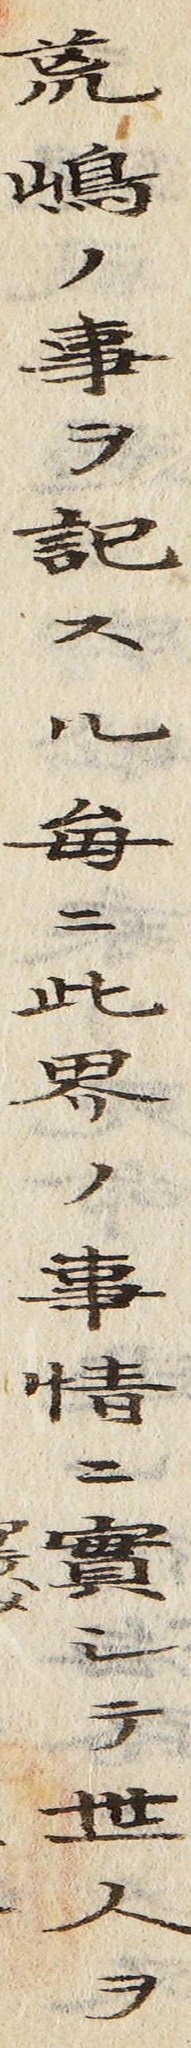荒島ノ事ヲ記スル毎ニ此界ノ事情ニ実シテ世人ヲ
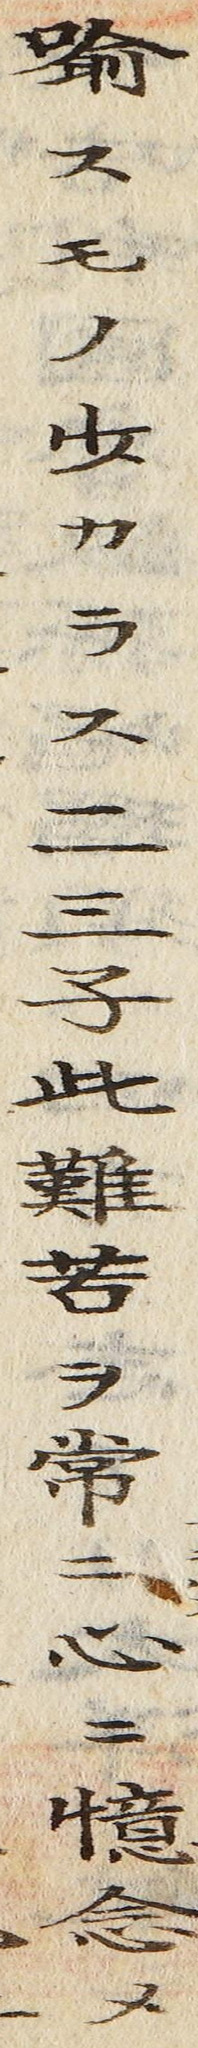喩スモノ少カラス二三子此難苦ヲ常ニ心ニ憶念シテ
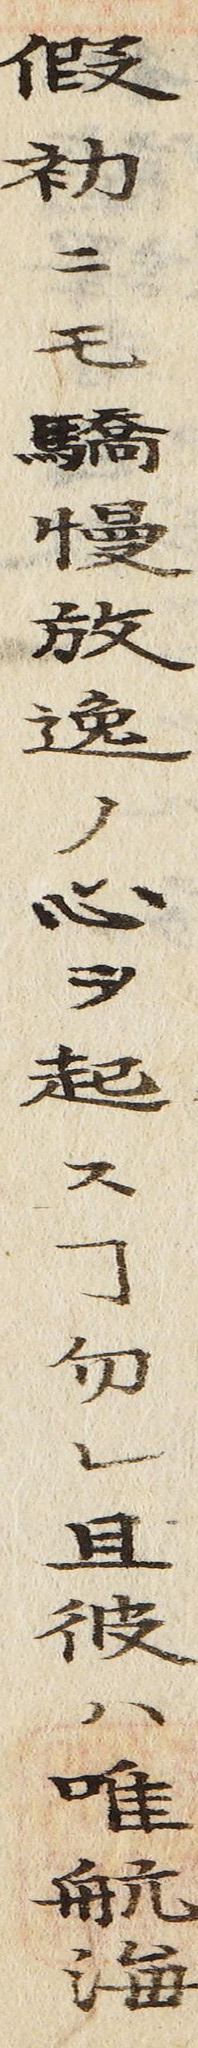仮初ニモ驕慢放逸ノ心ヲ起スコト勿レ且彼ハ唯航海
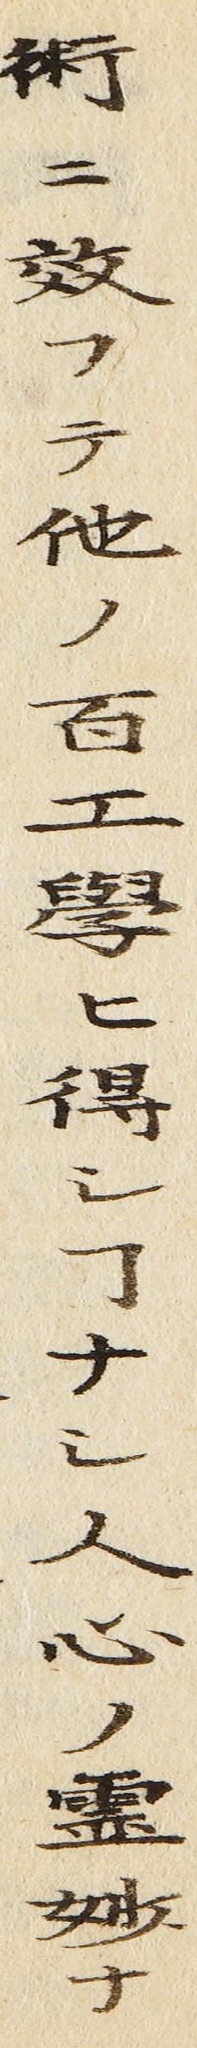術ニ効フテ他ノ百工学ヒ得シコトナシ人心ノ霊妙ナ
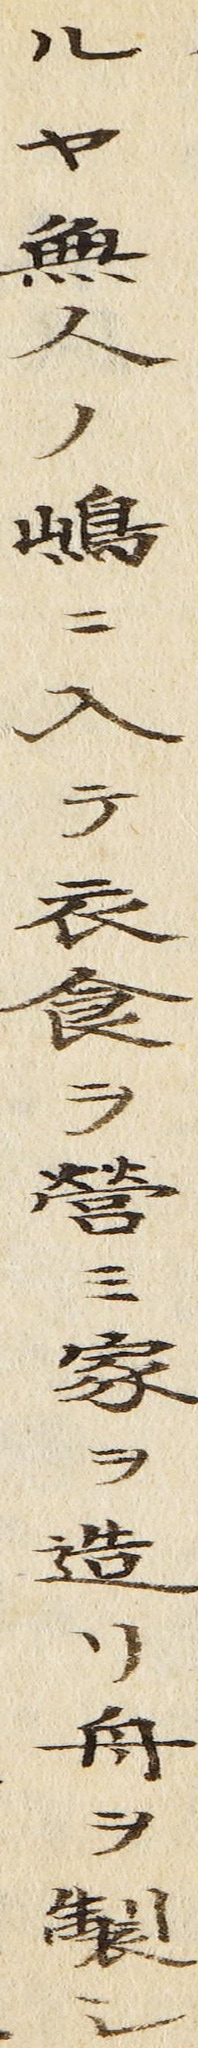ルヤ無人ノ島ニ入テ衣食ヲ営ミ家ヲ造リ舟ヲ製シ
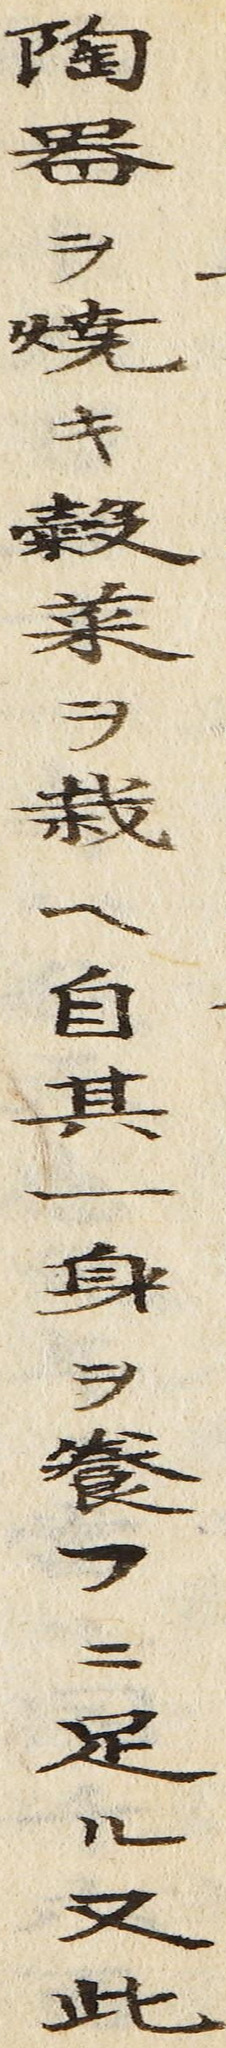陶器ヲ焼キ穀菜ヲ栽ヘ自其一身ヲ養フニ足ル又此
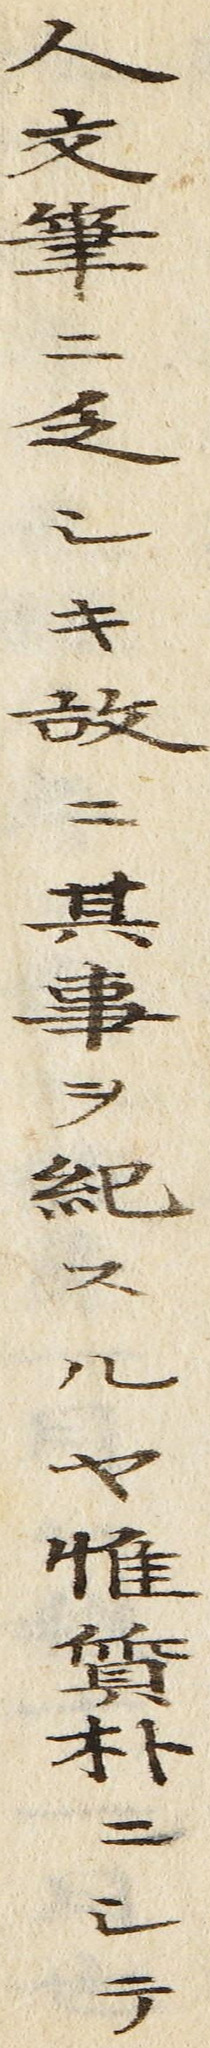人文筆ニ乏シキ故ニ其事ヲ紀スルヤ惟質朴ニシテ
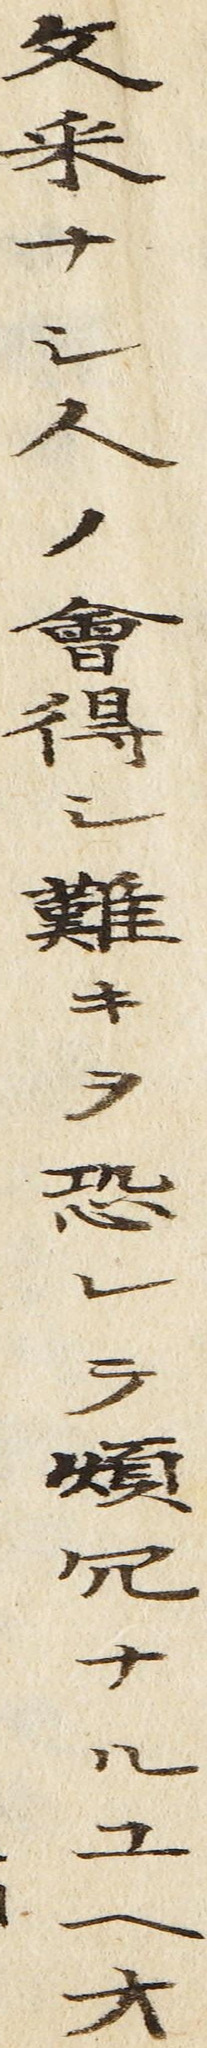文采ナシ人ノ会得シ難キヲ恐レテ煩冗ナルユヘ才
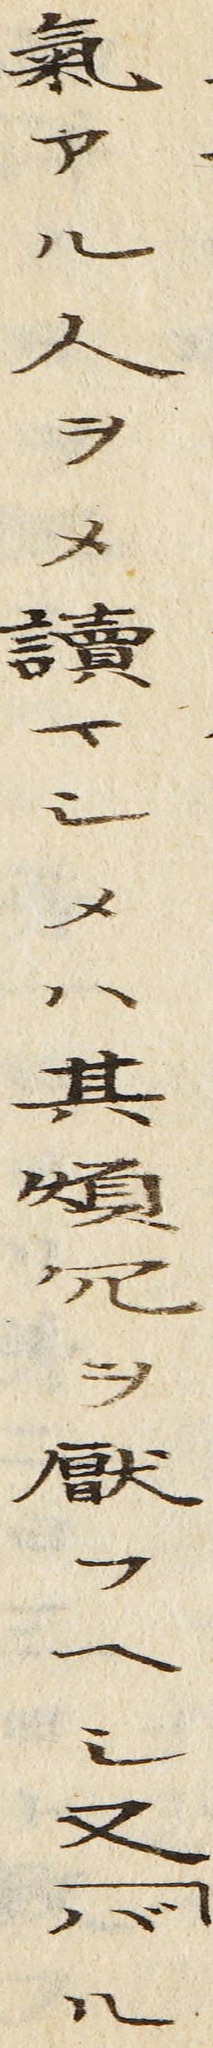気アル人ヲシテ読マシメハ其煩冗ヲ厭フヘシ又「バル
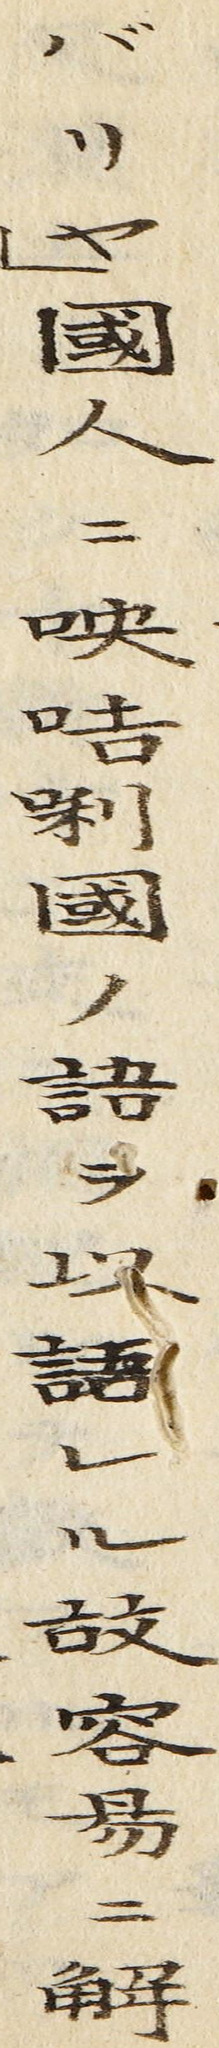バリヤ」国人ニ咉咭唎国ノ語ヲ以語レル故容易ニ解
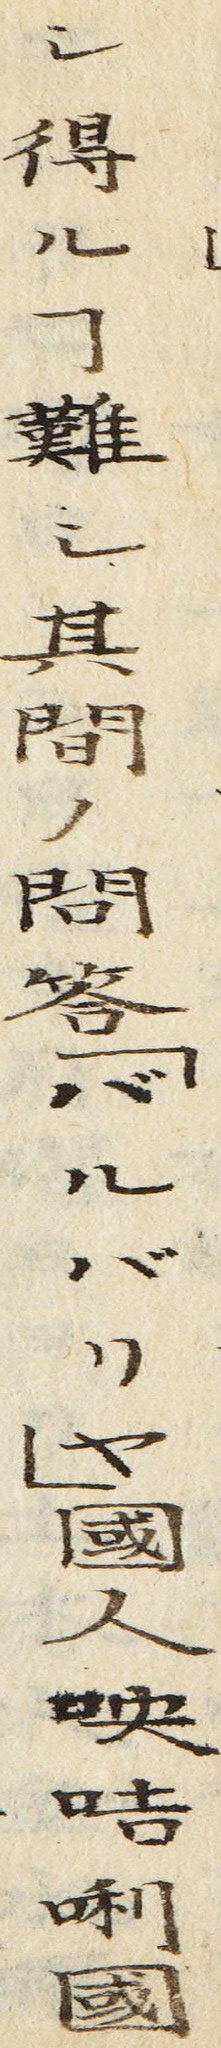シ得ルコト難シ其間ノ問答「バルバリヤ」国人咉咭唎国
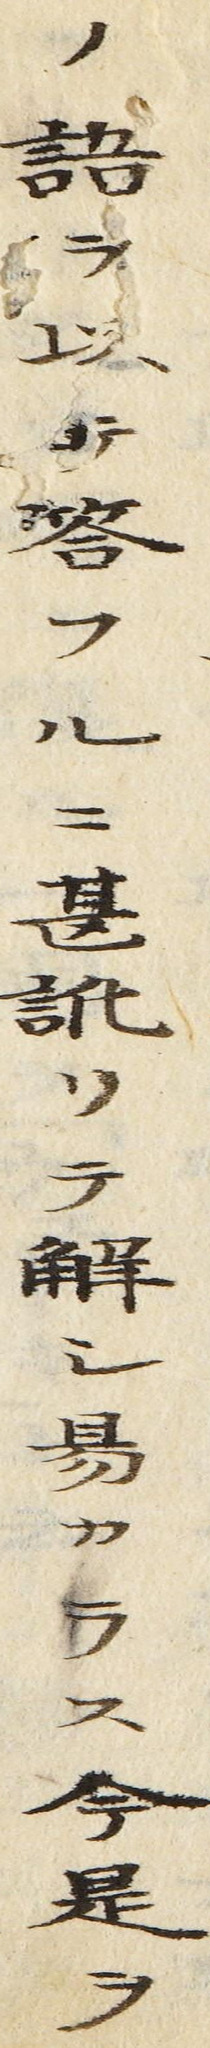ノ語ヲ以テ答フルニ其訛リテ解シ易カラス今是ヲ
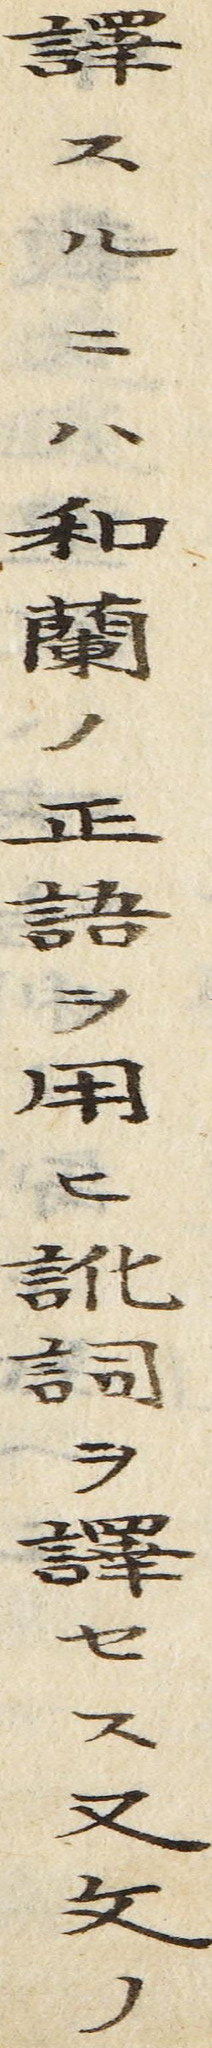訳スルニハ和蘭ノ正語ヲ用ヒ訛詞ヲ訳セス又文ノ
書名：漂流紀事
